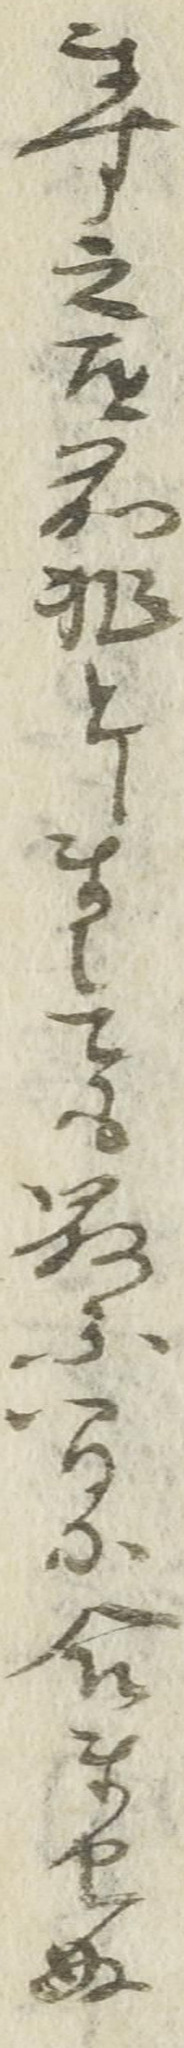ます之を前兆としましても最ふ間に合ませぬ
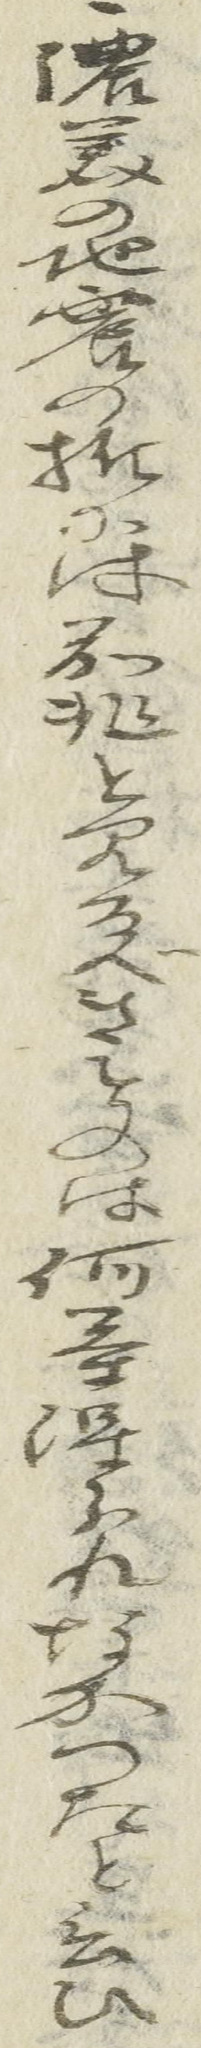一濃美の地震の折には前兆と見るべきものは何等得られなかつたと云ひ
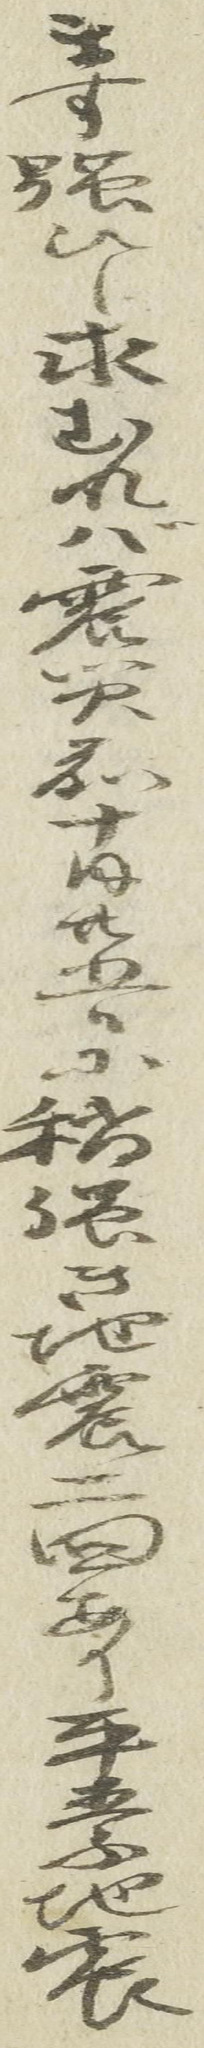ます強ひし求むれば震災前十月廿五日に稍強き地震二回あり平常地震
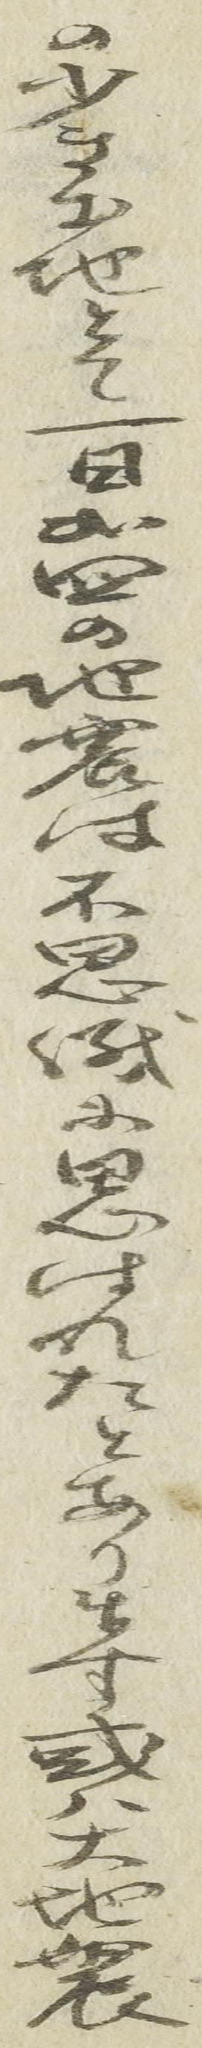の少き土地とて一日弐回の地震は不思議に思はれたとあります或は大地震
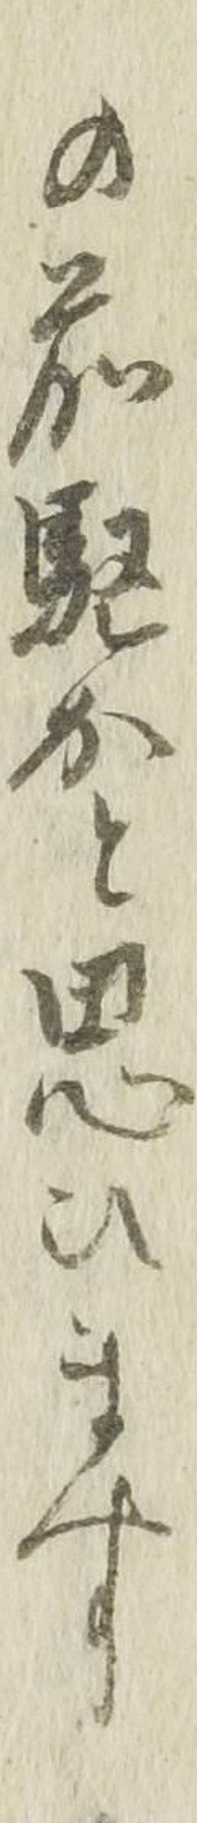の前駆かと思ひます
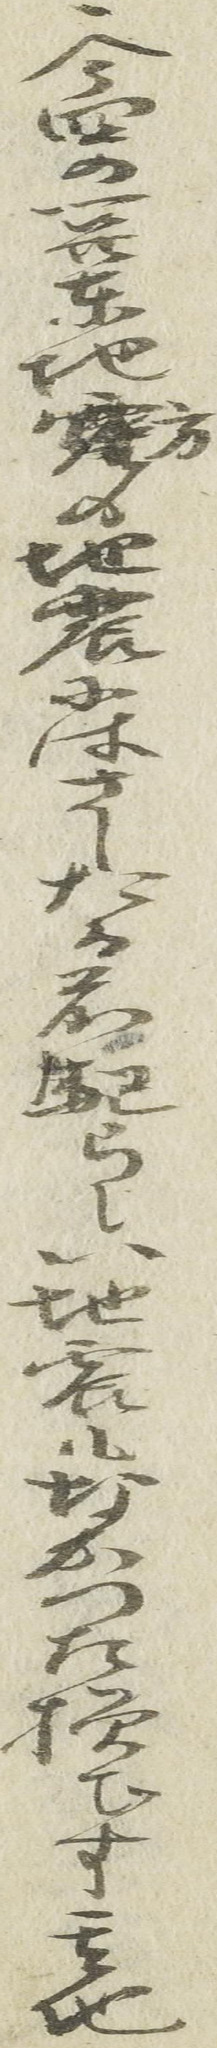一今回の関東地震の地震にはさしたる前駆らしい地震もなかつた様です其他
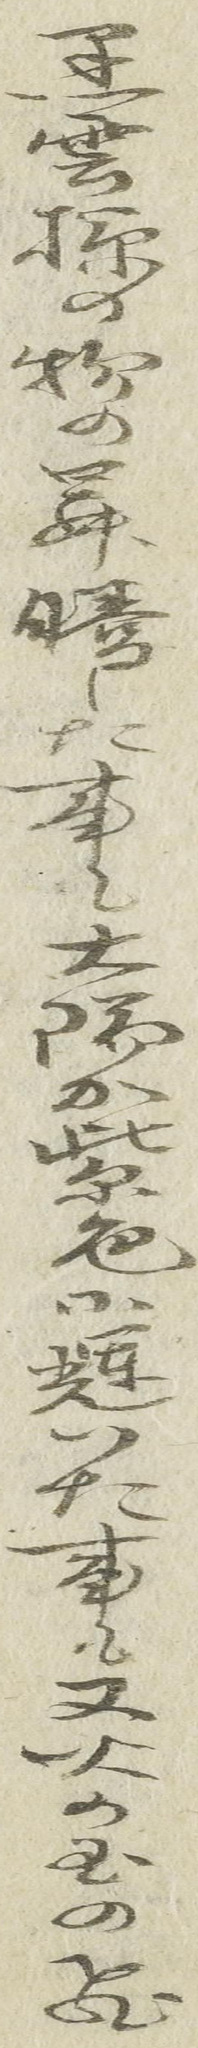黒雲様の物の昇騰した事も太陽か紫色に輝いた事も又火の玉の飛
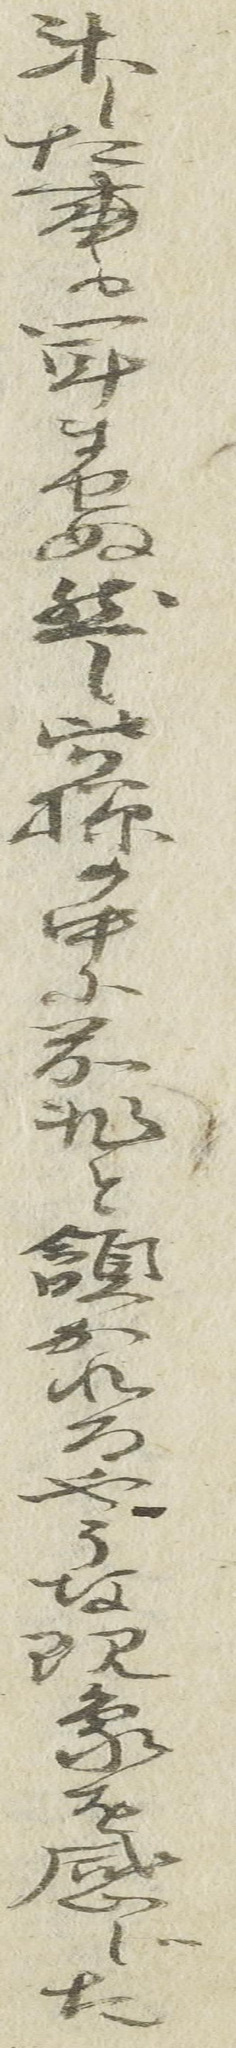来した事も聞ませぬ然し此の様の中に前兆と頷かれるやうな現象を感じた
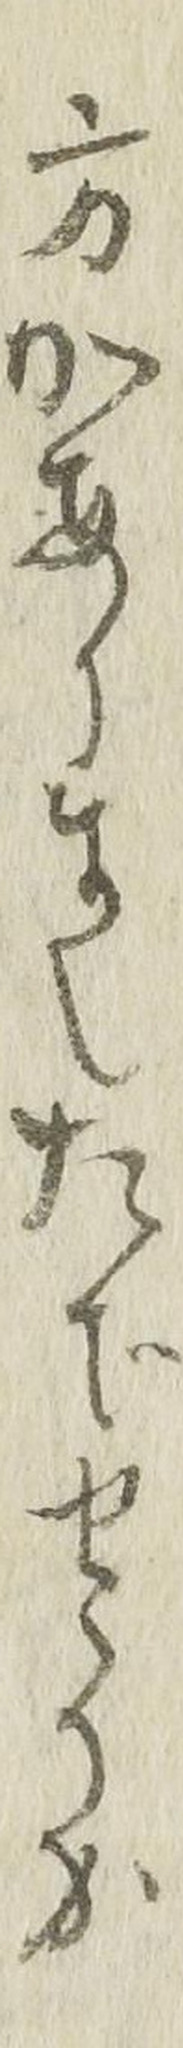方かありましたでせうか

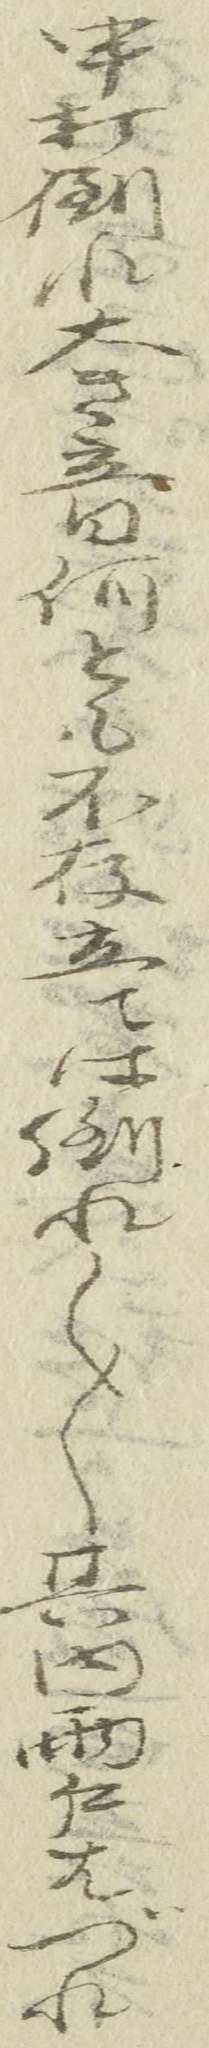申打倒れ大き音何とも不存立ては倒れ〳〵〳〵其内雨戸はづれ
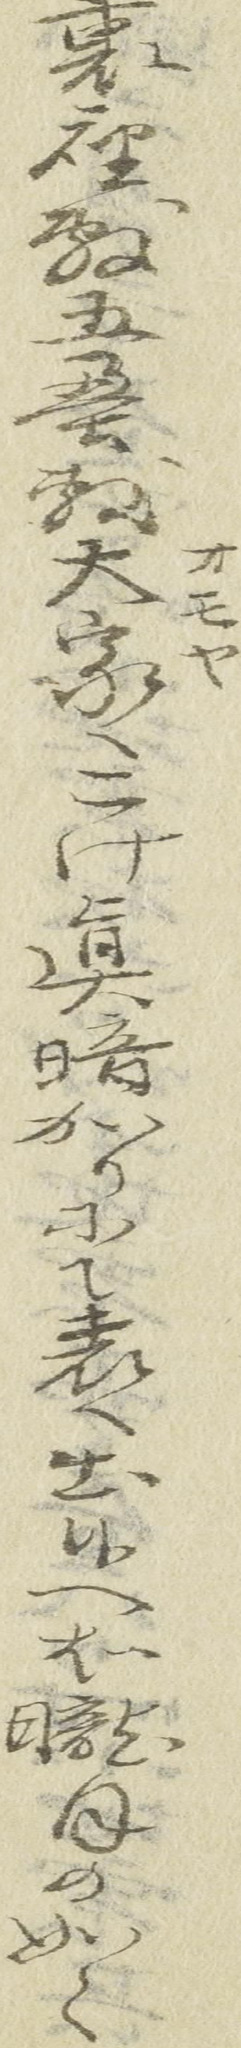裏座敷五畳敷大家へこけ真暗がりにて表へ出候朧月の如く
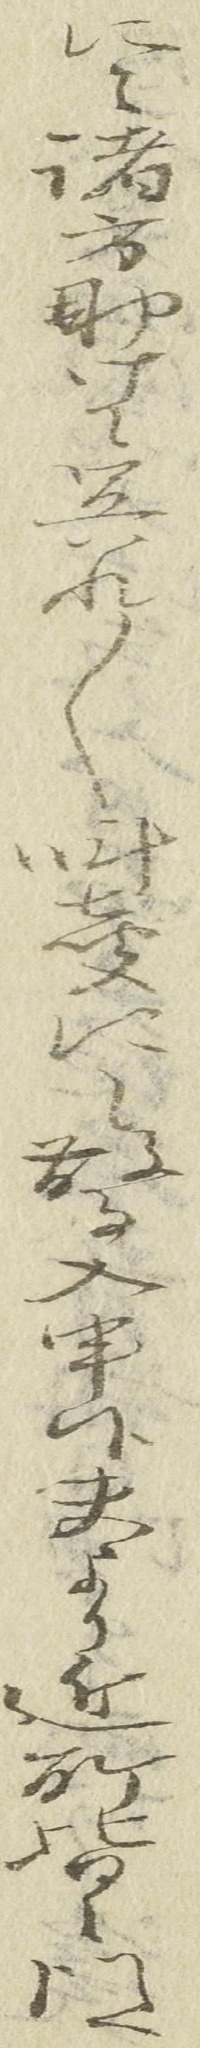にて諸方助けて呉れ〳〵叫声にも驚入申候夫より近所皆々門へ
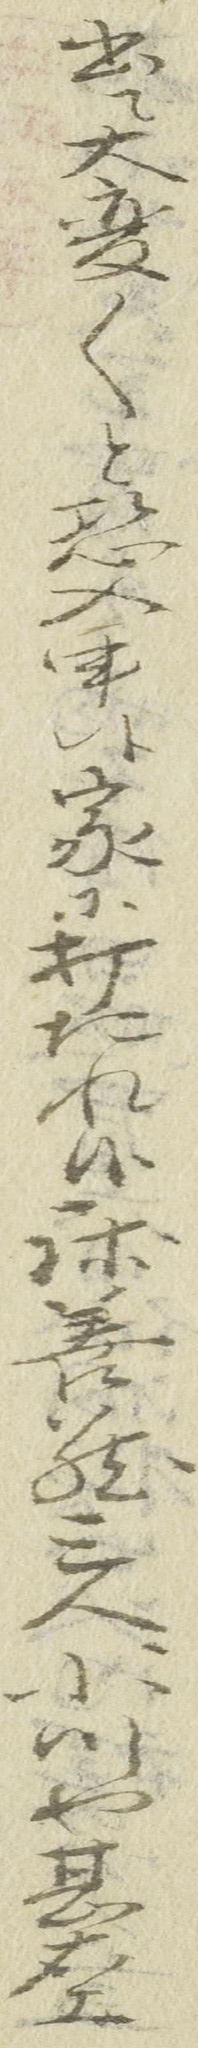出て大変〳〵と恐入申候家に打たれ候弥善蔵三人、小川や甚右エ
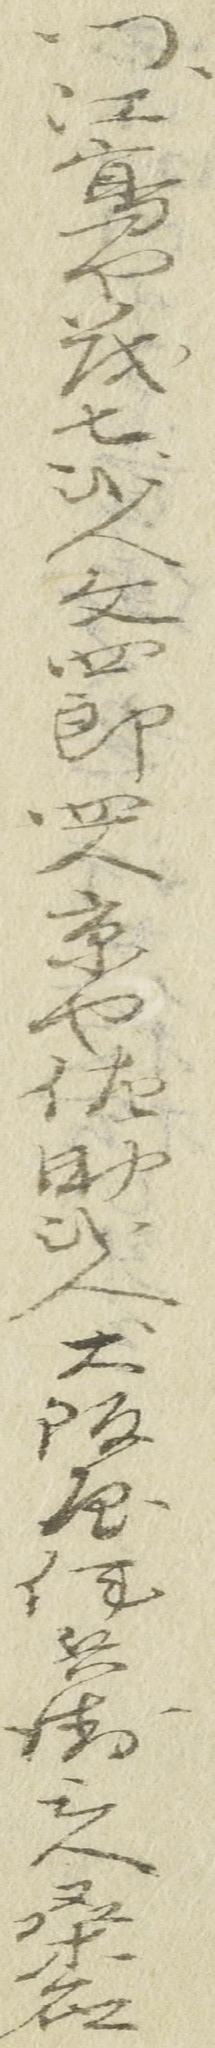門、江嶌や茂七、弐人文四郎四人京や佐助弐人、大阪屋伊兵衛三人桑名
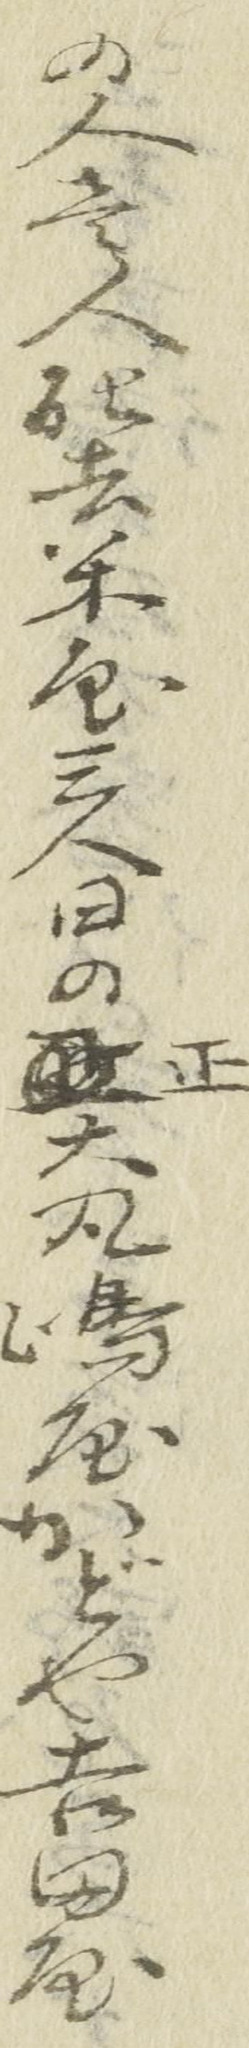の人壱人死去米屋三人日の丑大丸嶋屋かどや吉田屋
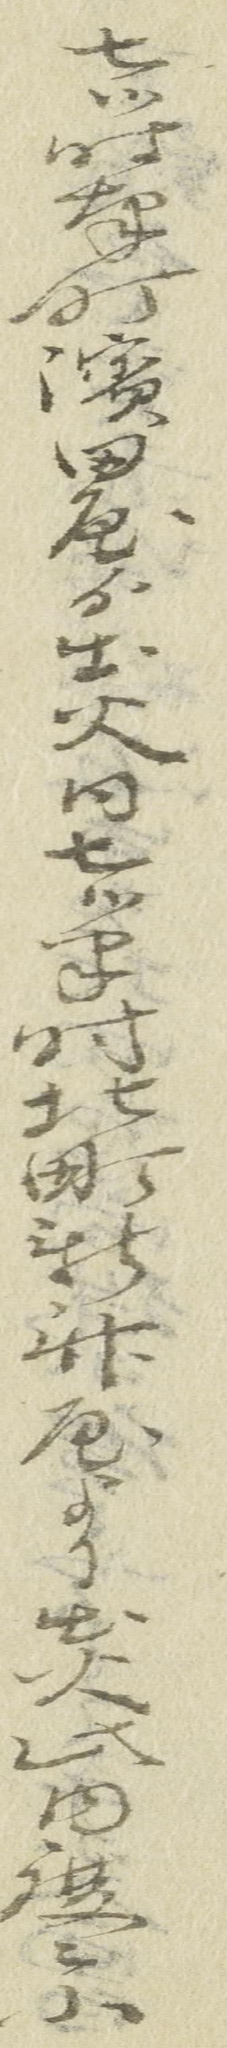一七つ時南町濱田屋ゟ出火同七つ半時北町新升屋より出火此内度々小
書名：地震前兆集　全
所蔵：東京大学地震研究所図書室 Earthquake Research Institute Library, The University of Tokyo, JAPAN
